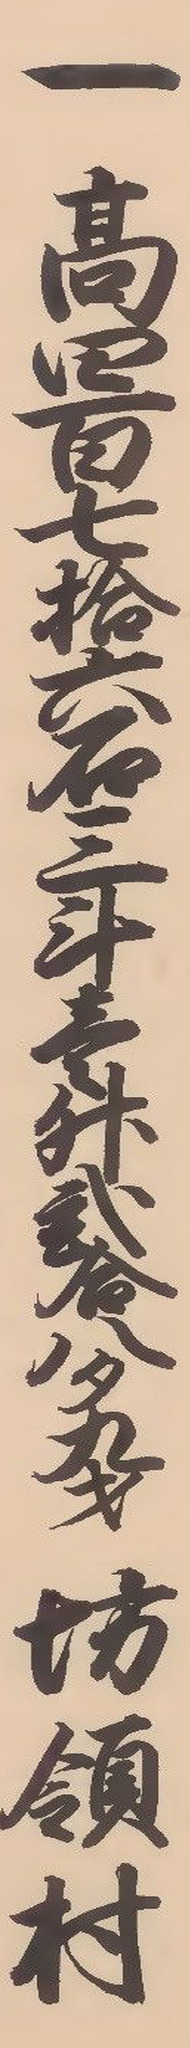一高四百七拾六石三斗壱升弐合八勺九才坊領村
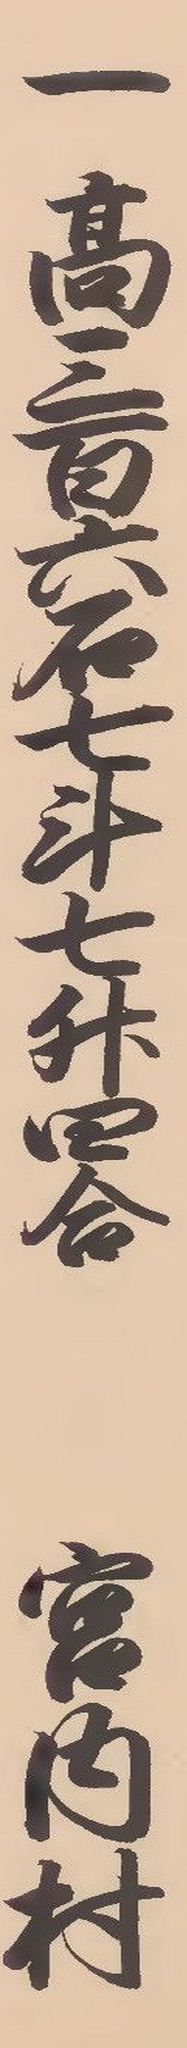一高三百六石七斗七升四合宮内村
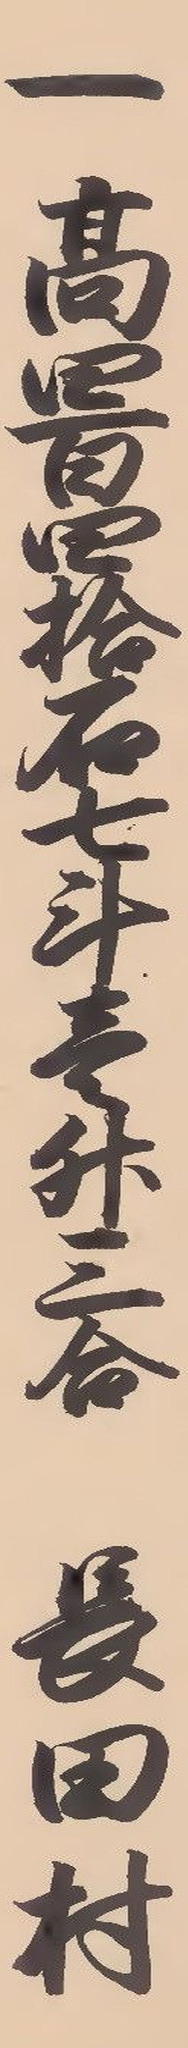一高四百四拾石七斗壱升三合長田村
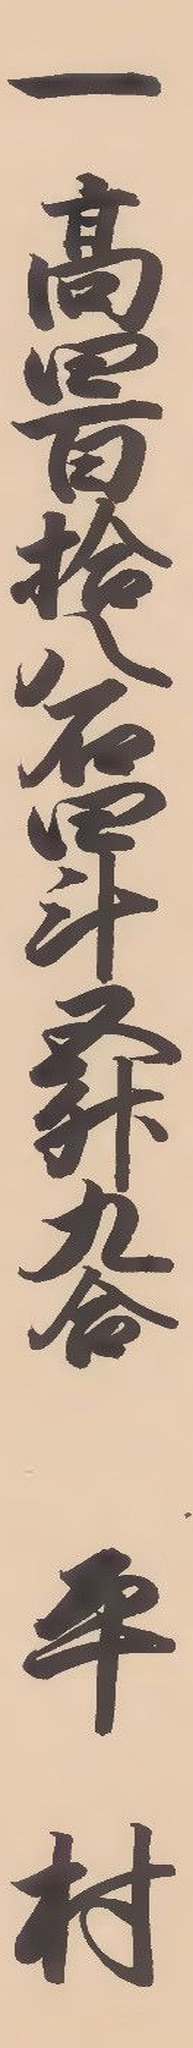一高四百拾八石四斗五升九合平村
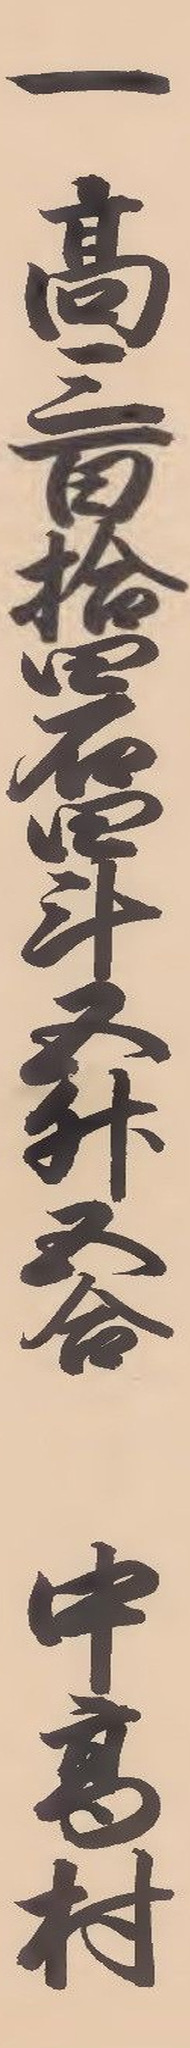一高三百拾四石四斗五升五合中高村
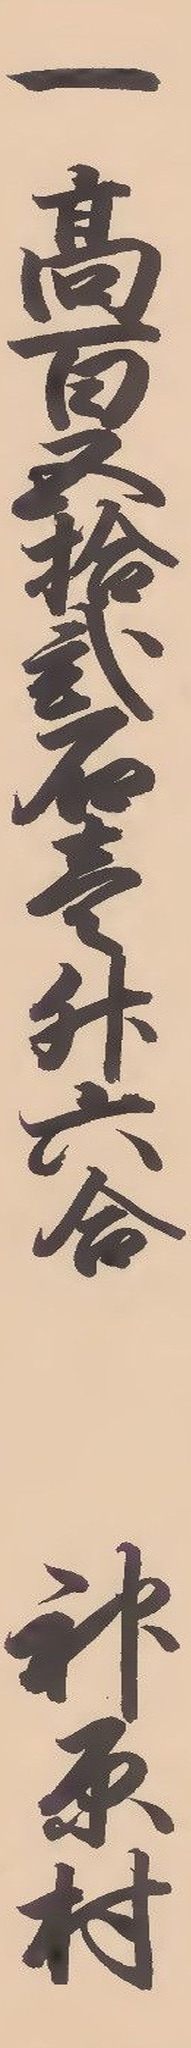一高百五拾弐石壱升六合神原村

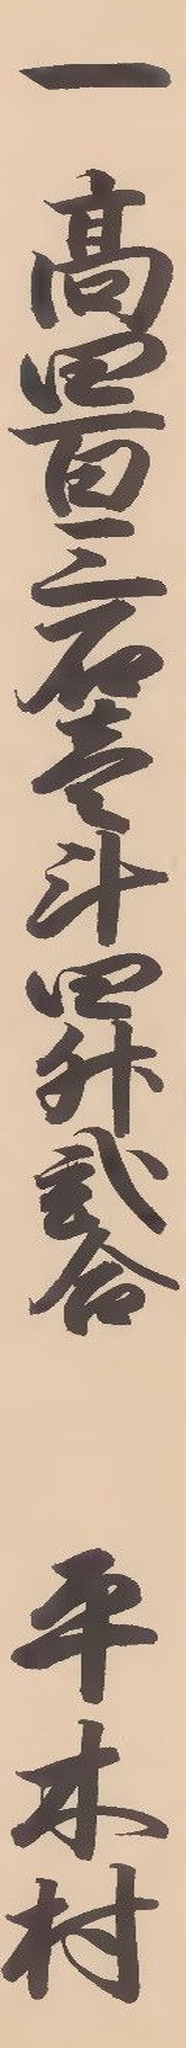一高四百三石壱斗四升弐合平木村
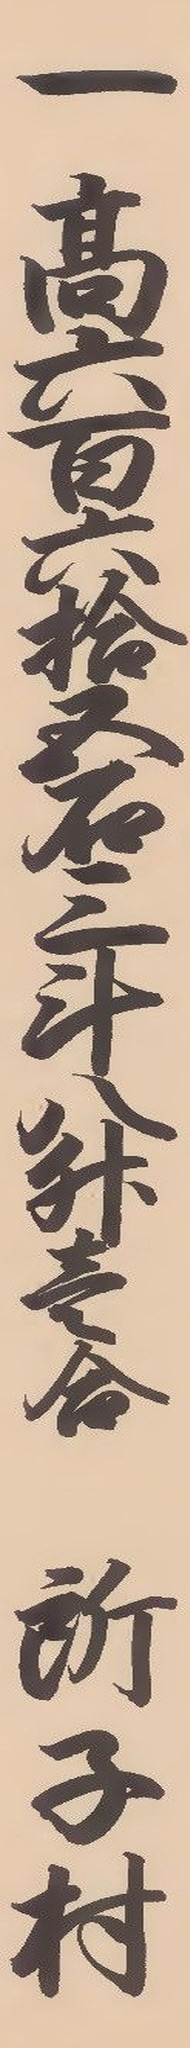一高六百六拾五石三斗八升壱合所子村
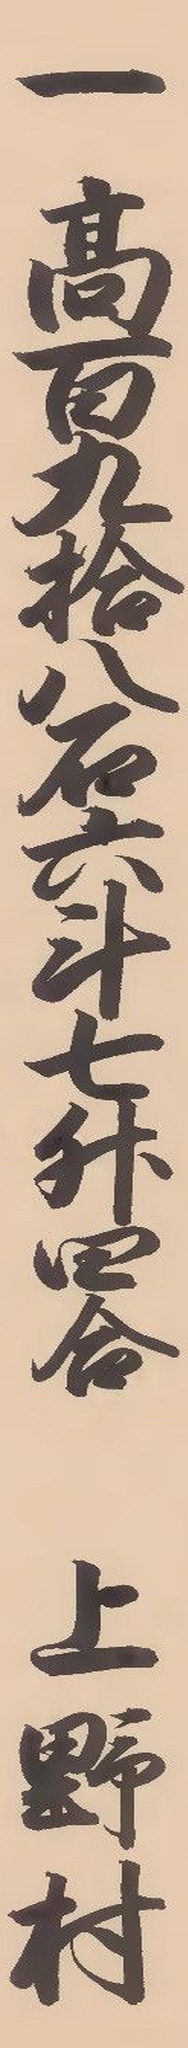一高百九拾八石六斗七升四合上野村
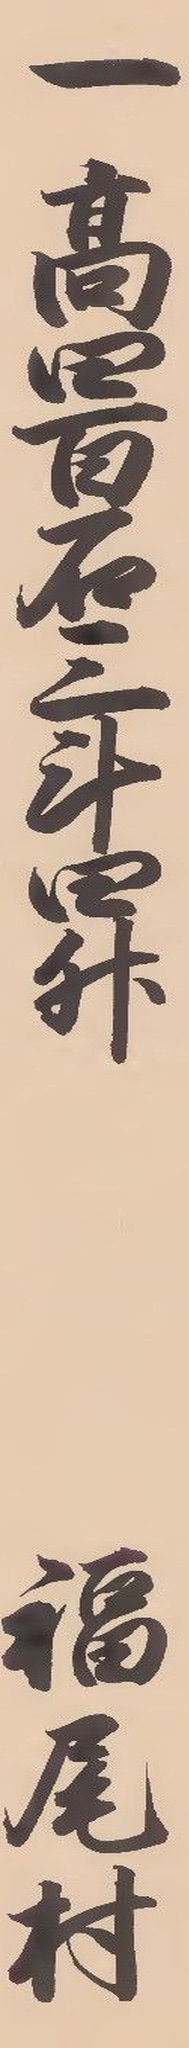一高四百石三斗四升福尾村
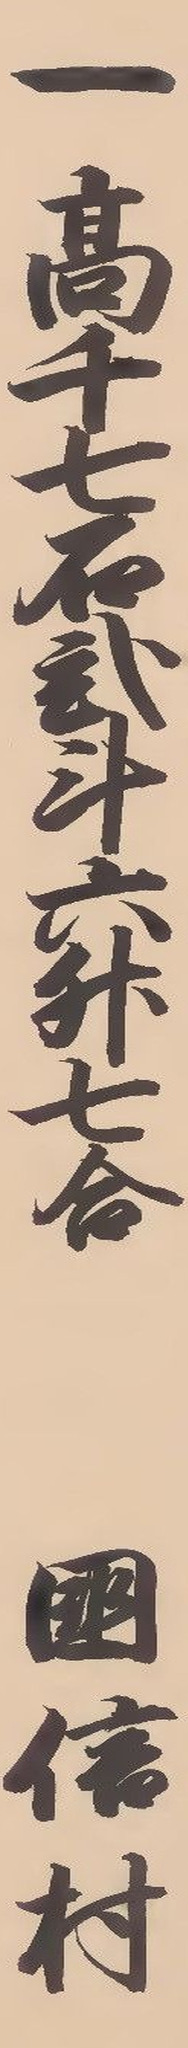一高千七石弐斗六升七合国信村
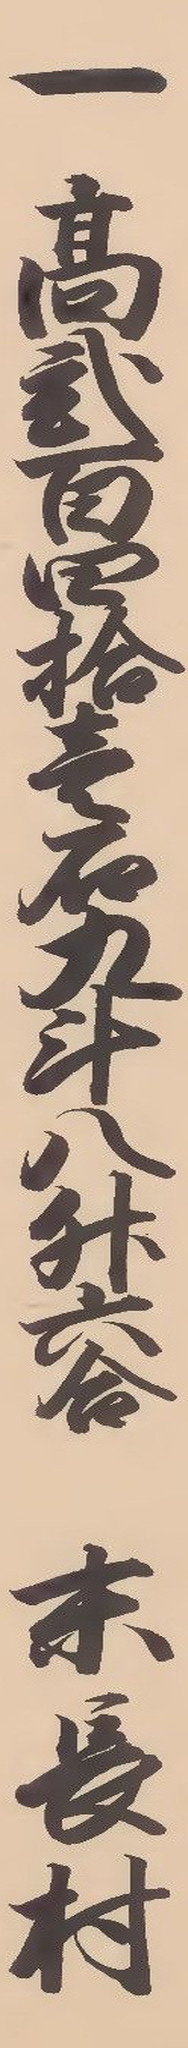一高弐百四拾壱石九斗八升六合末長村
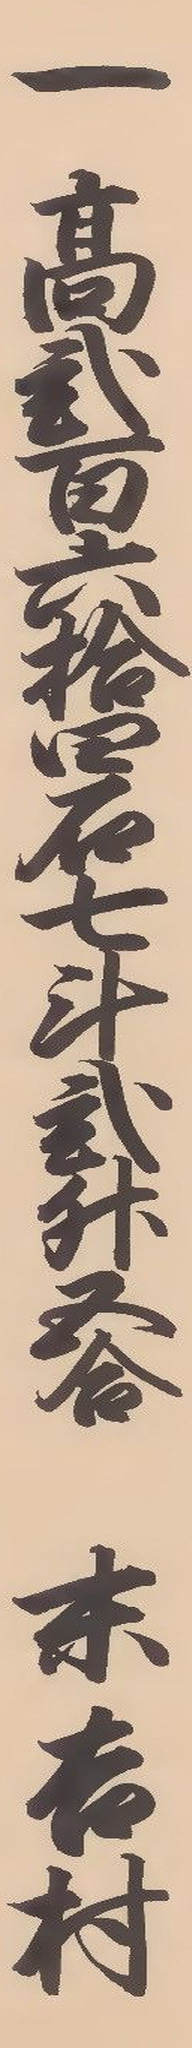一高弐百六拾四石七斗弐升五合末吉村
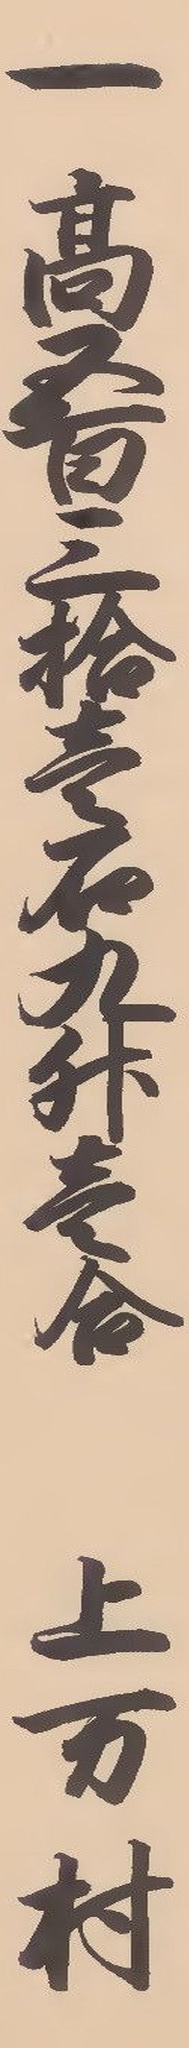一高五百三拾壱石九升壱合上万村

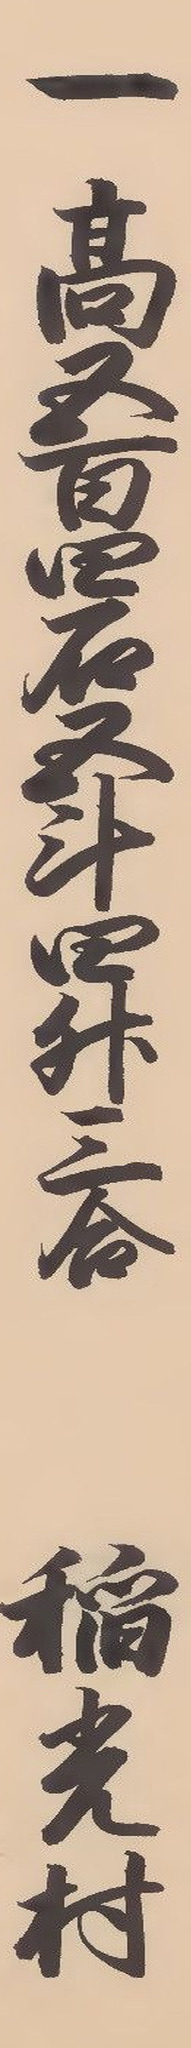一高五百四石五斗四升三合稲光村
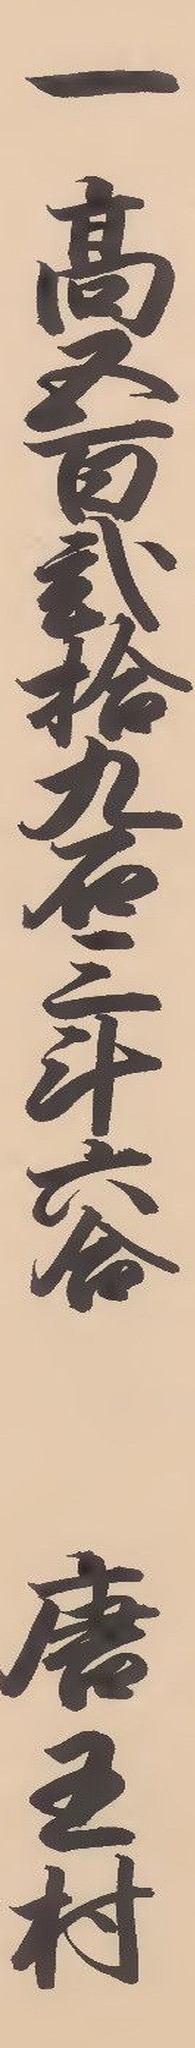一高五百弐拾九石三斗六合唐王村
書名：伯耆国郷帳
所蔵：国立公文書館 National Archives of Japan
